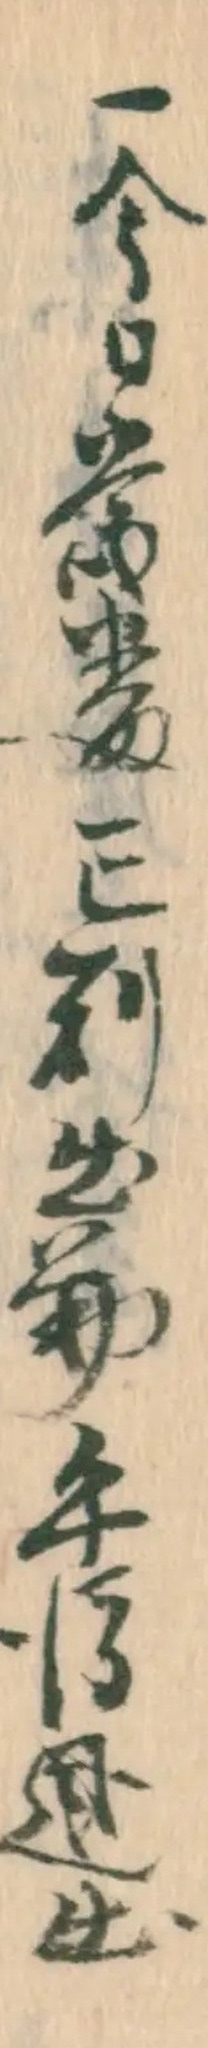一今日当番巳刻出勤午後退出
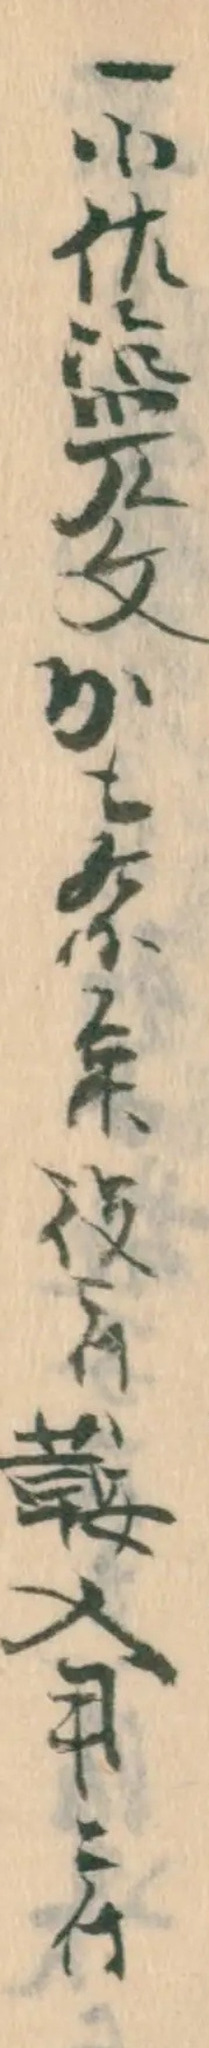一小佐治光文かも祭参役ニ付鞍入用ニ付
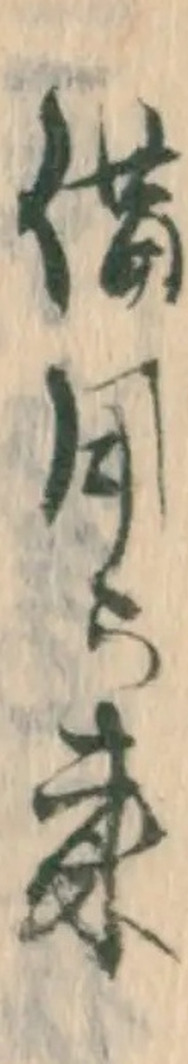借用被来
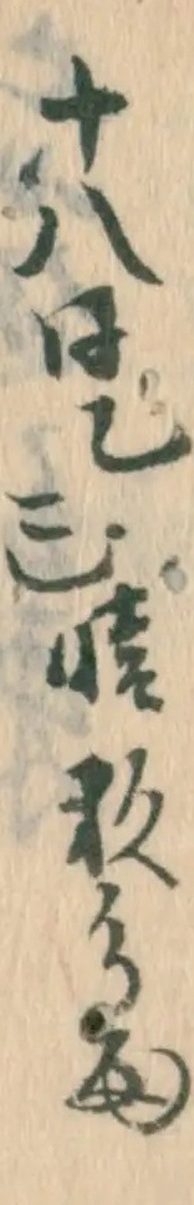十八日乙巳晴数分雨
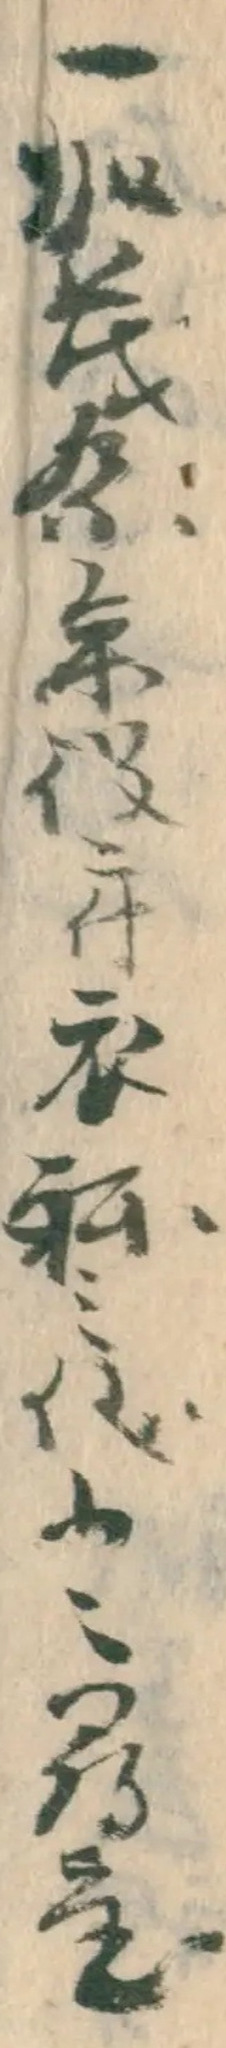一加茂祭参役ニ付衣体之儀少々尋置
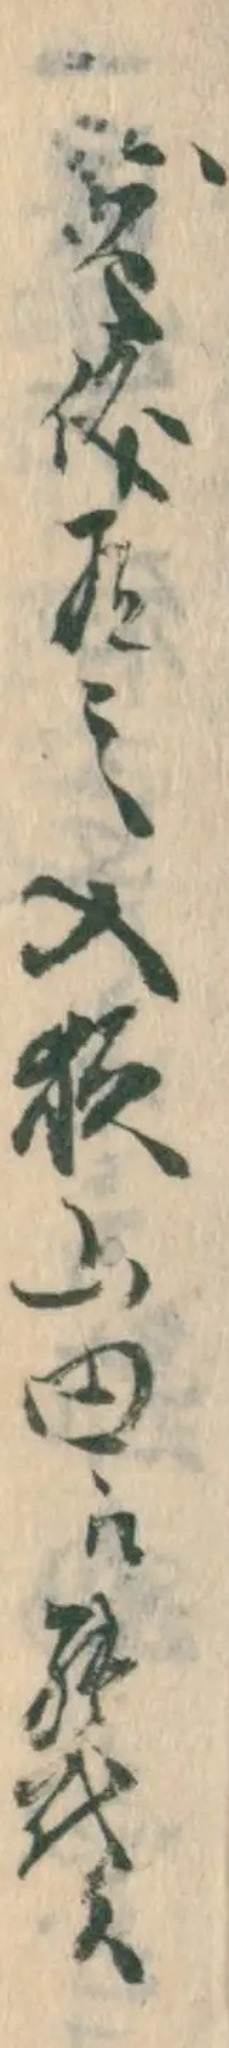度儀有之入夜山田え罷越ス

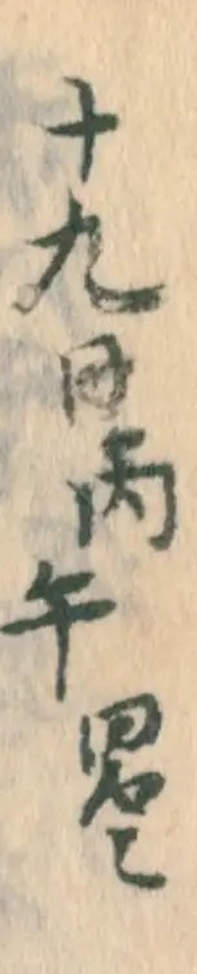十九日丙午曇
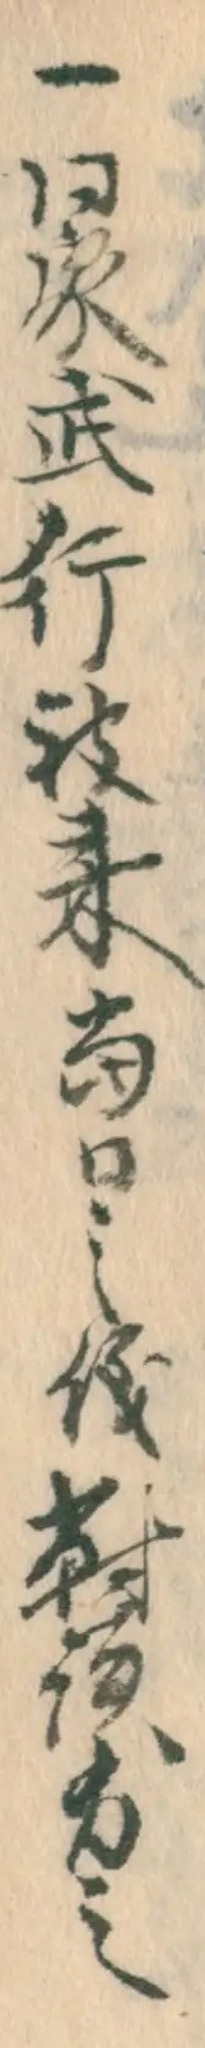一同家武行被来当日之儀対談有之
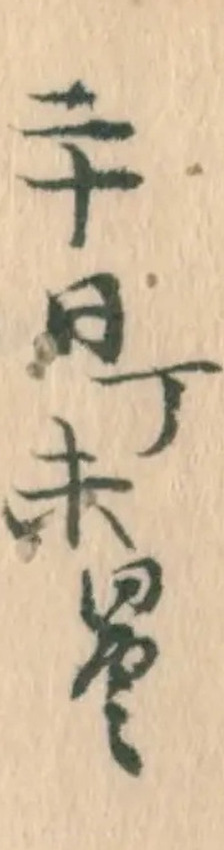二十日丁未曇
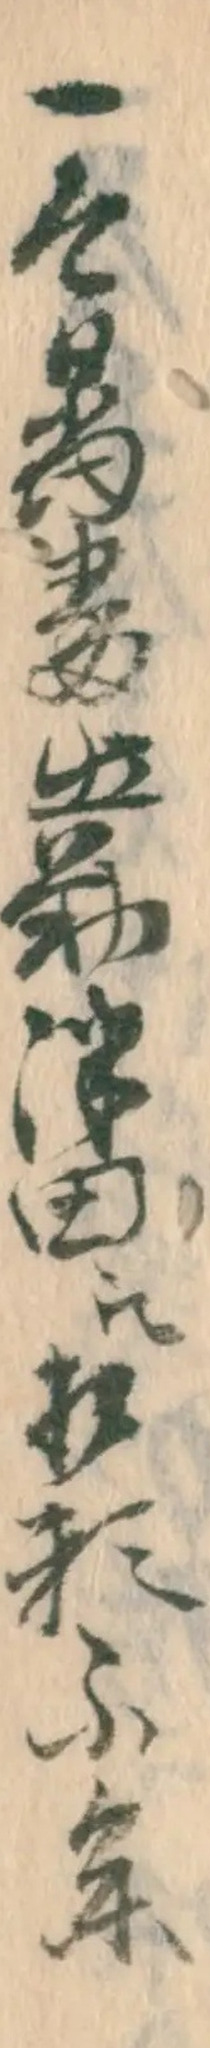一今日当番出勤浮田え相頼不参
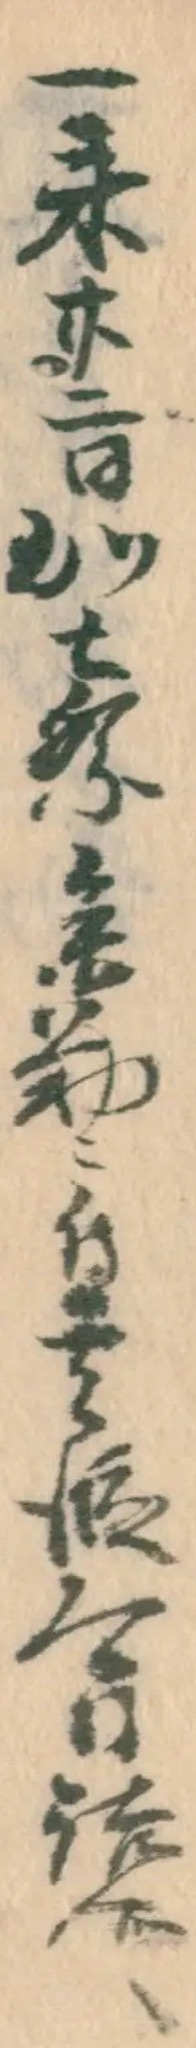一来廿二日加も祭参勤ニ付其段今日詰所へ
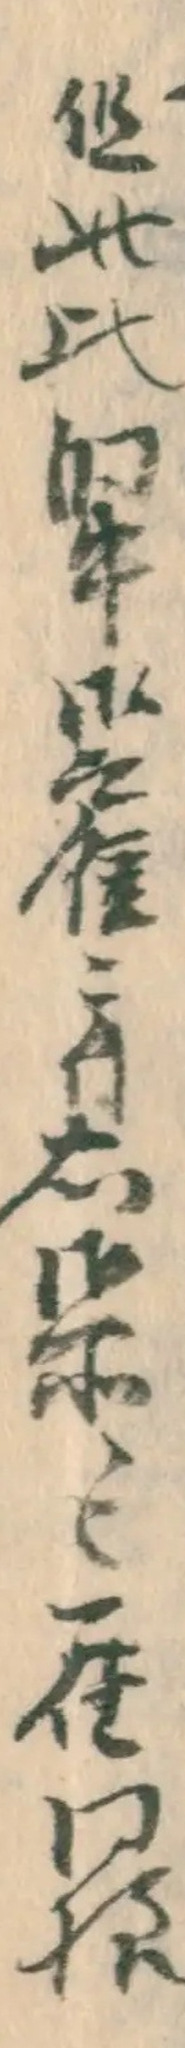但此頃洞中御雇ニ付右御所へ被雇同様
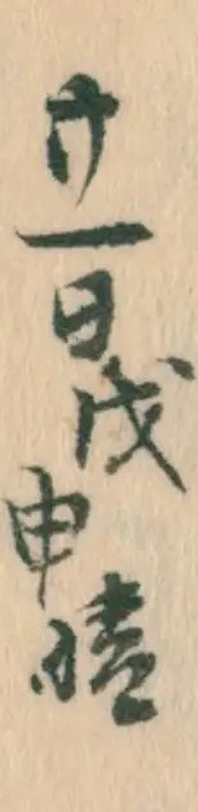廿一日戊申晴
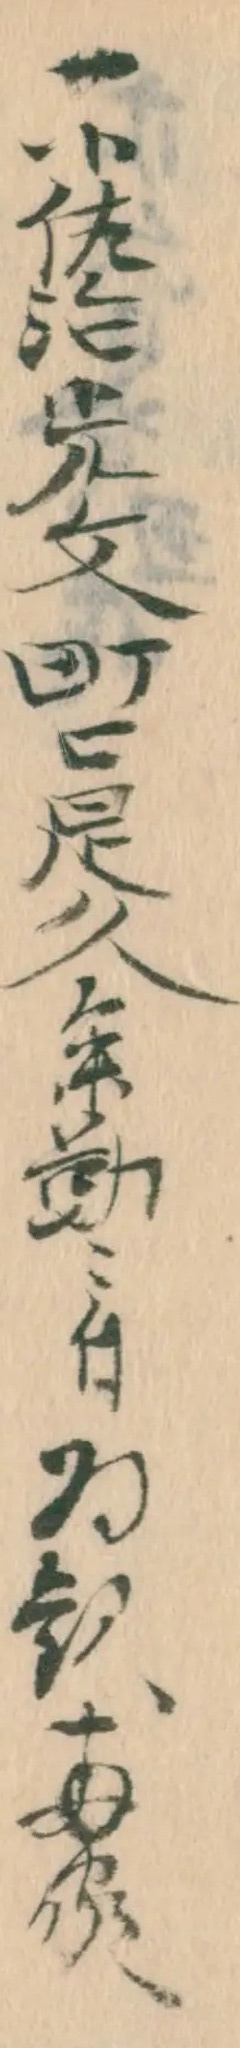一小佐治光文町口是久参勤ニ付為歓両家へ
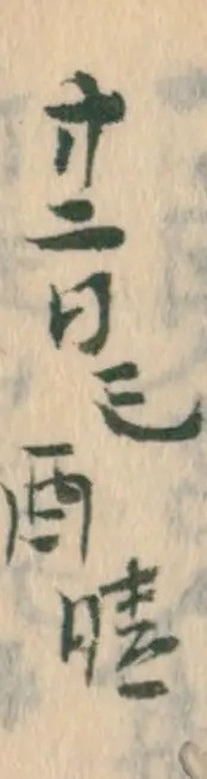廿二日己酉晴
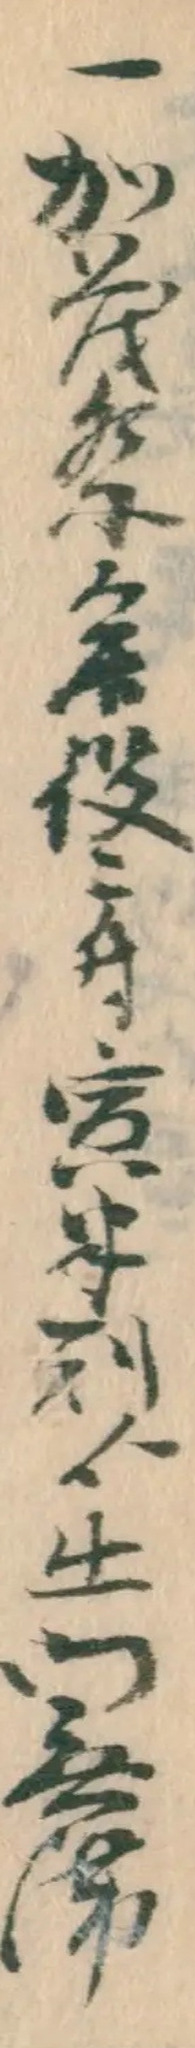一加茂祭参役ニ付寅半刻ゟ出門無滞
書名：禁裏御所御用日記. [131]
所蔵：国立国会図書館 National Diet Library, JAPAN
